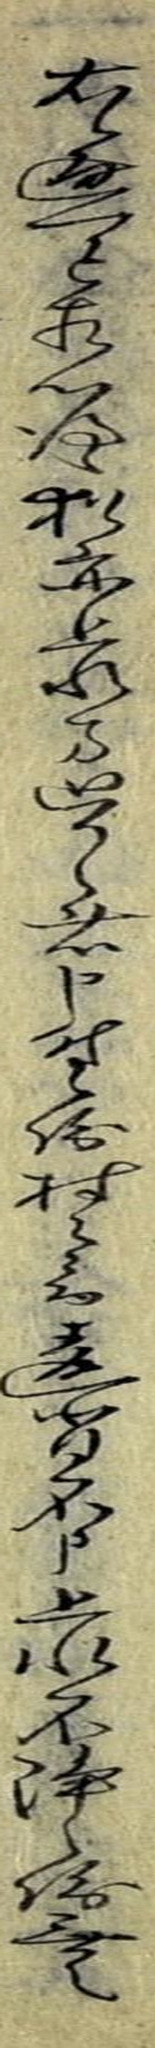右之通可被相心得候猶亦上水方廻り之者申付候儀村々ニ而違背不申上水不浄之儀無之
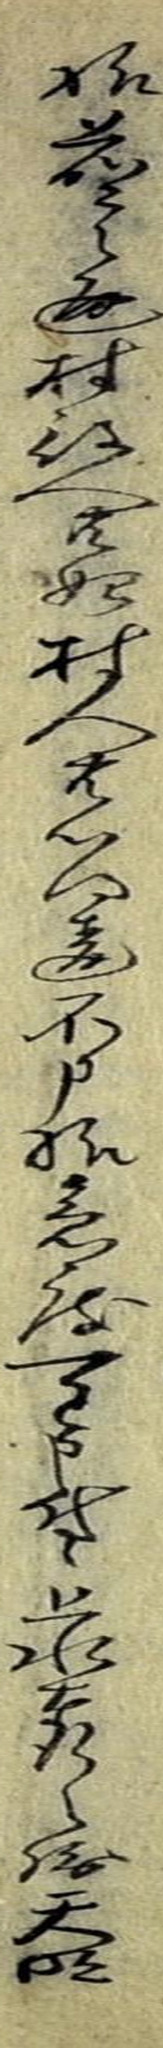様前々之通村役人共始村人共心得違不申様急度可被申付候上水奉行之儀天明
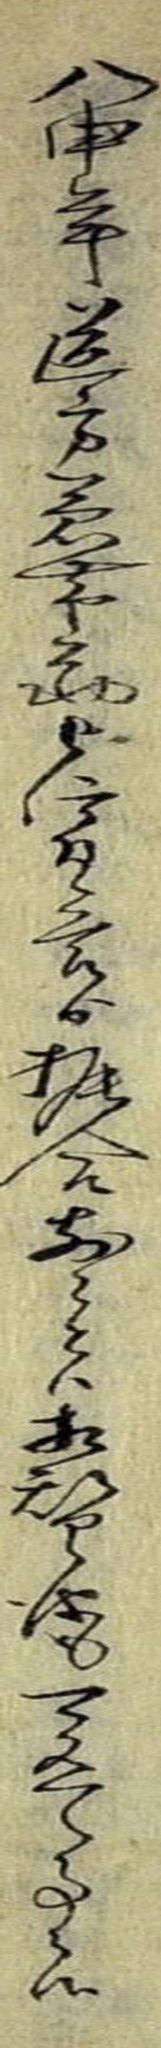八申年道方兼帯勤被仰付候節ゟ振合前々とハ相替候儀も可有之事ニ候
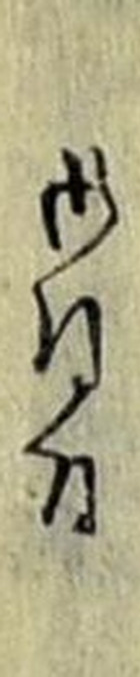御目付
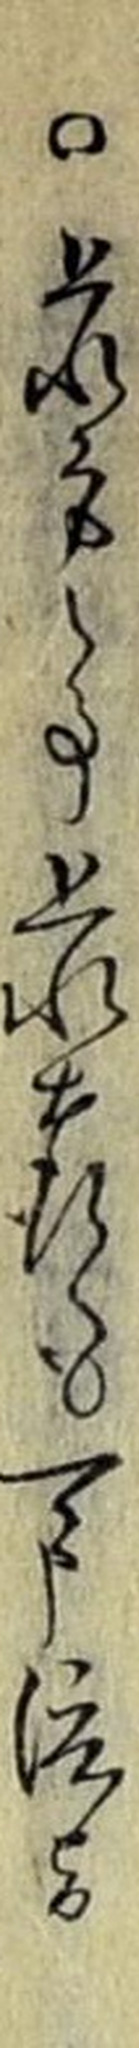〇上水方之事上水奉行へも可申渡旨
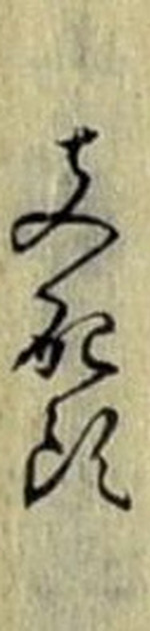支配頭
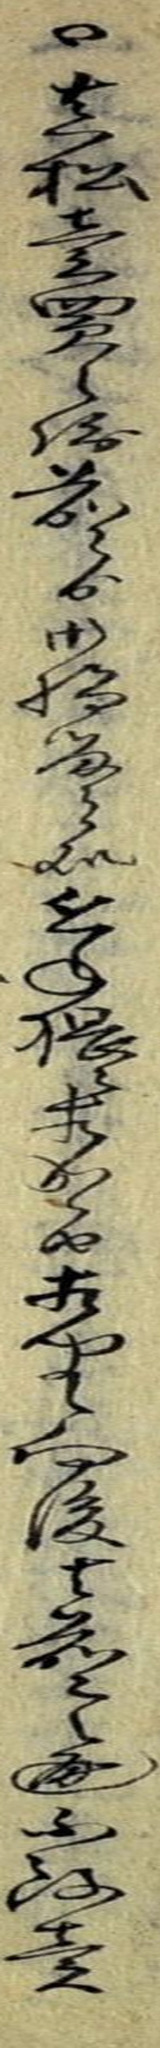〇真松売買之儀前々ゟ御指留ニ候処近年猥ニ相成候由相聞候向後者前々之通不致売
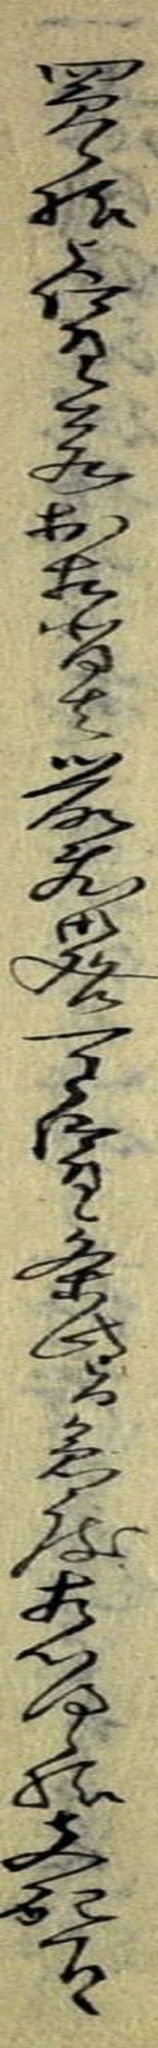買候様被仰付候若於相背者厳敷御咎可被仰付候条此旨急度相心得候様支配下へ
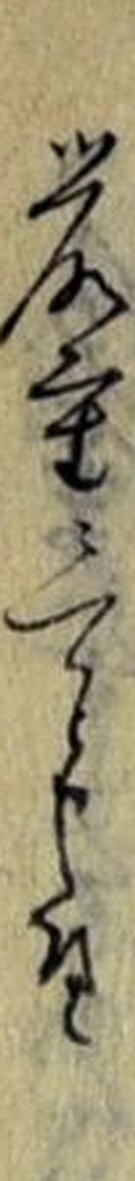厳重ニ可被申付候
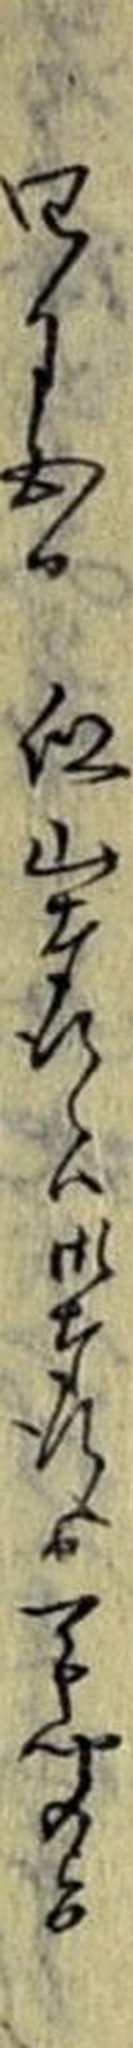四月五日但山奉行ヘハ御奉行ゟ可申聞旨
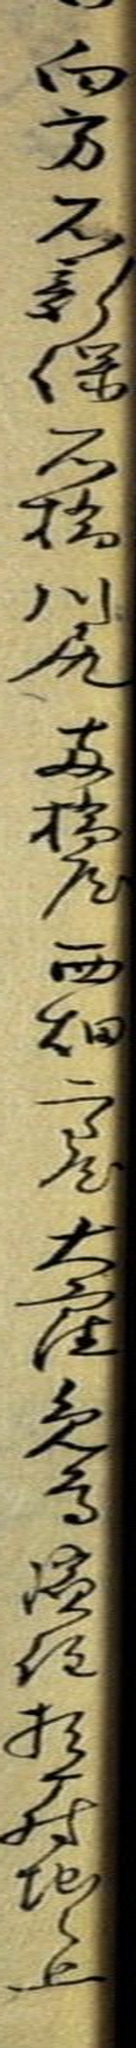〇白方石新保石橋川尻両橋屋西畑高屋大窪免鳥浜住拾ケ村地之上
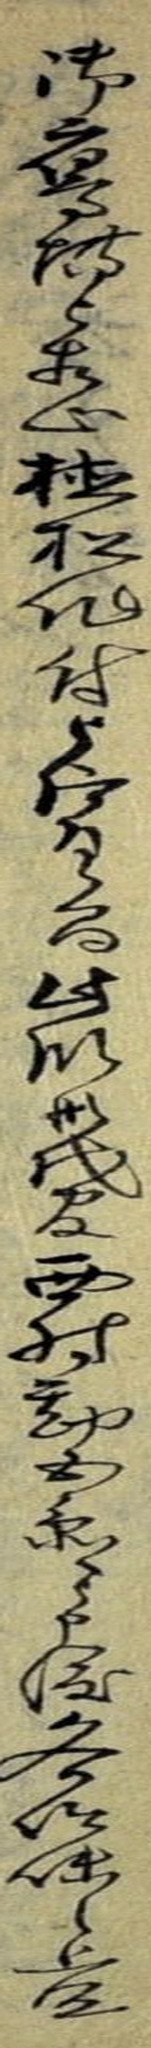御鷹場被相止植松作付被仰付候間此段御代官西村勘五兵衛へ被申渡各吟味之上宜
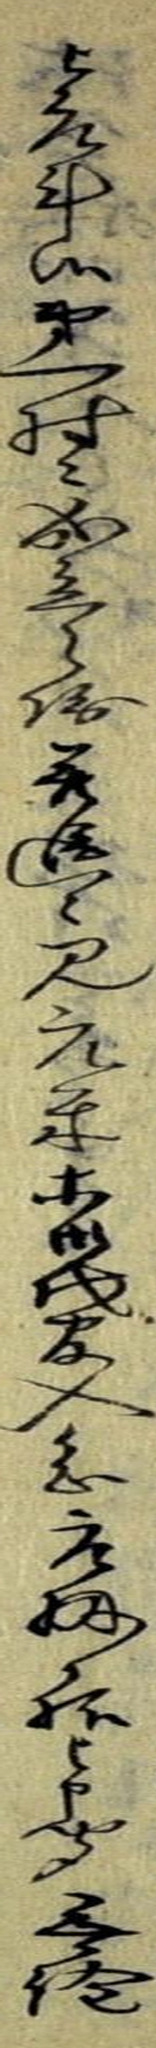被取計候第一村々成立之儀并追々見取米等御代官入念取扱候様被申聞無詮
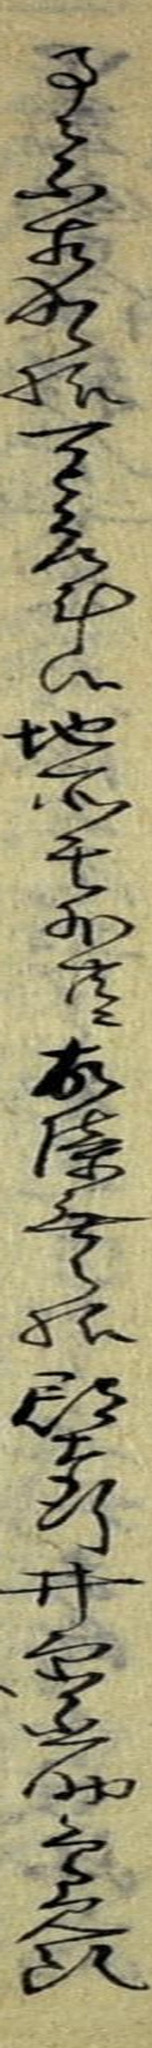事ニ不相成候様可被取計候地所其外共ニ故障無之様郡奉行井原丞助鳥見頭
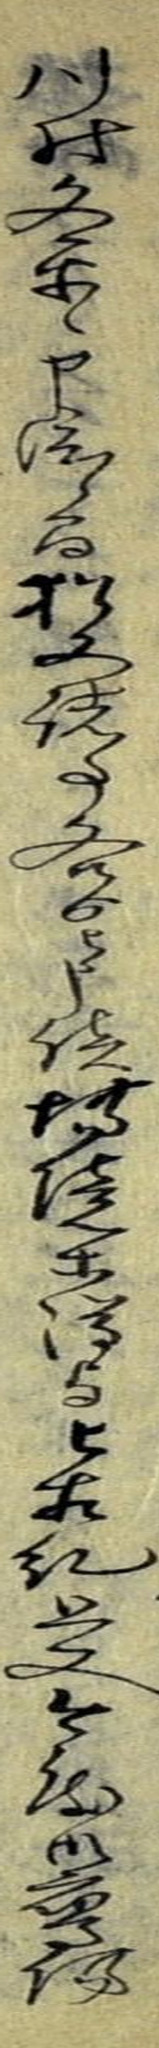川村文平へ申渡候間猶又諸事各ゟ被申談場境等得与被相糺且又今度御鷹場
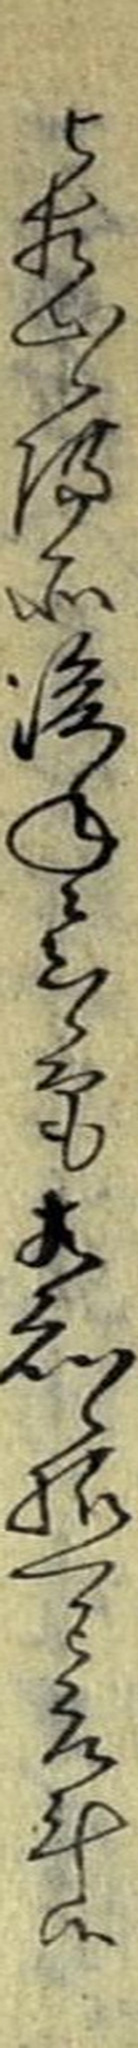被相止候場所後年ニ至候而も相知候様可被取計候
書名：命令之部 三
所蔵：福井県文書館 Fukui Prefectural Archives
